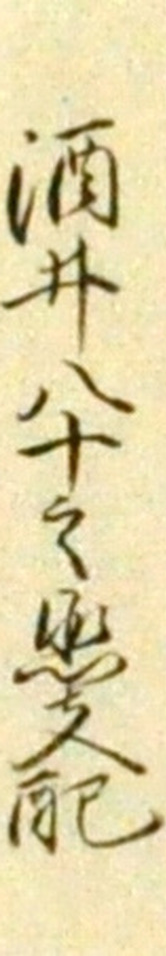酒井八十之丞支配
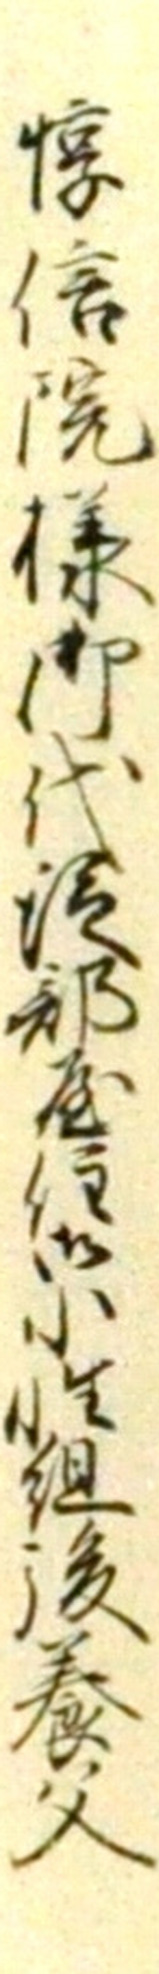惇信院様御代従部屋住御小姓組後養父

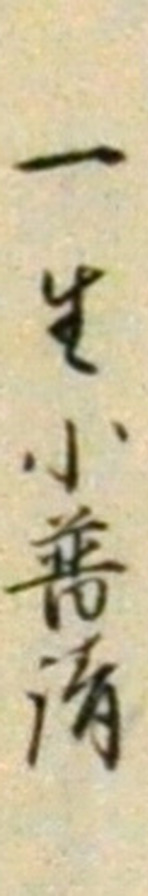一生小普請
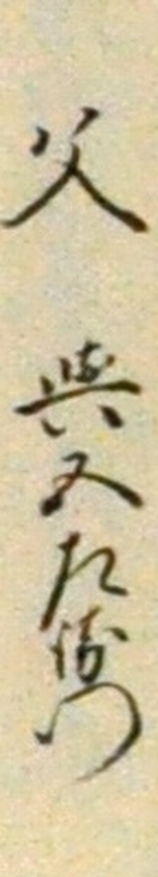父與五左衛門
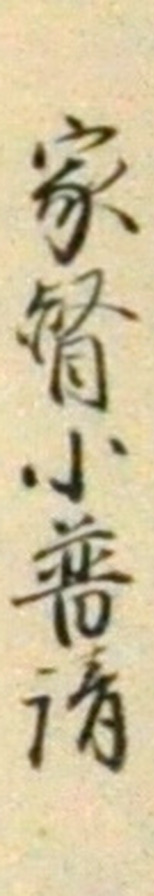家督小普請
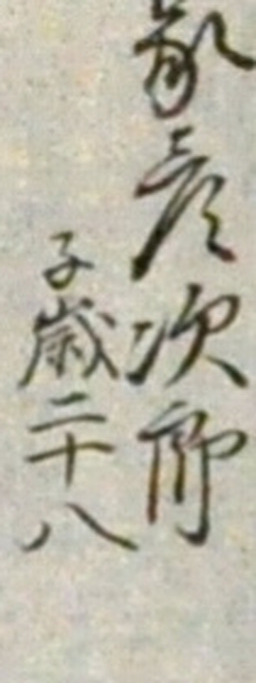子歳二十八
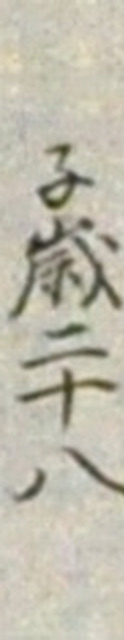子歳二十八
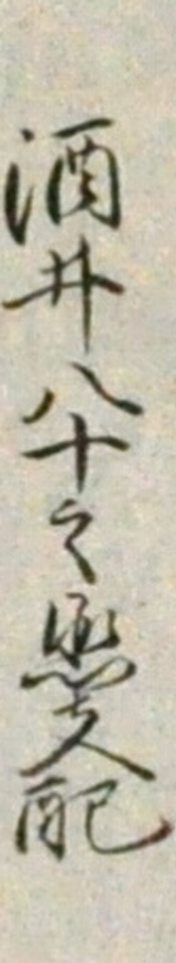酒井八十之丞支配
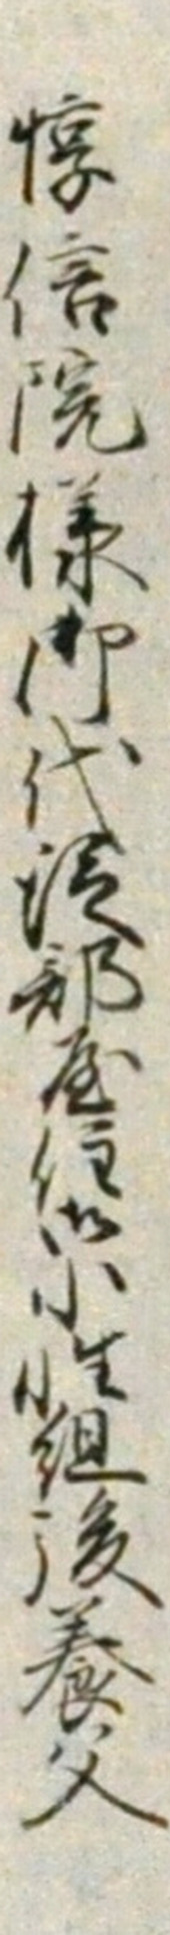惇信院様御代従部屋住御小姓組後養父
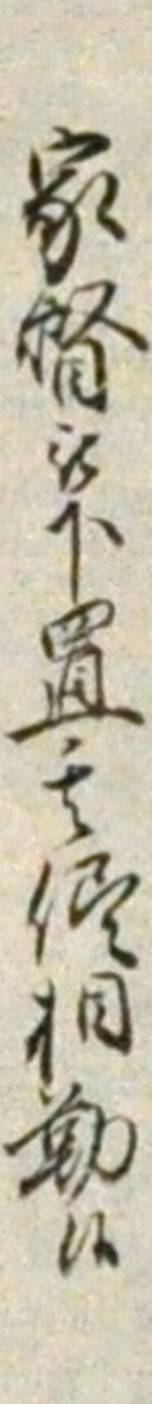家督被下置其侭相勤候
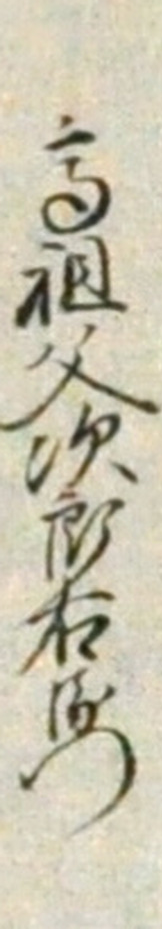高祖父次郎右衛門
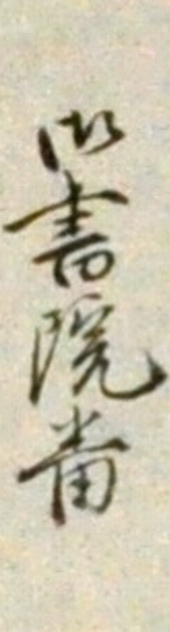御書院番
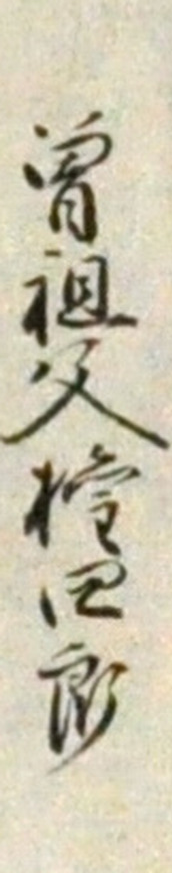曽祖父権四郎
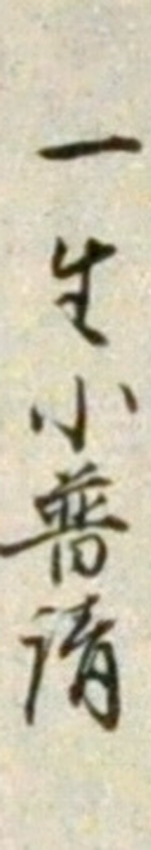一生小普請
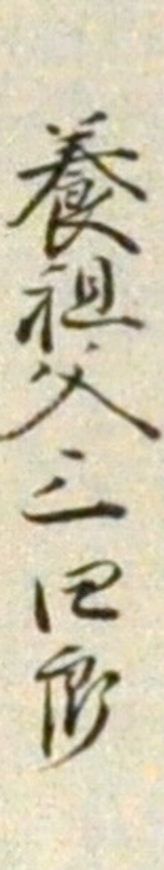養祖父三四郎
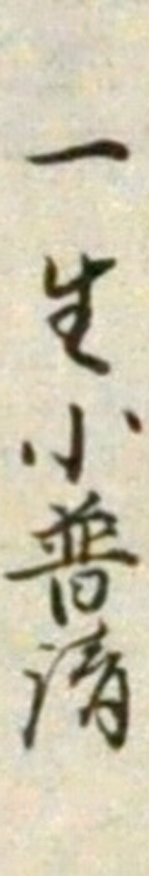一生小普請
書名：若年寄御役中御調書付
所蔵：伊那市立高遠町図書館・合同会社AMANE
